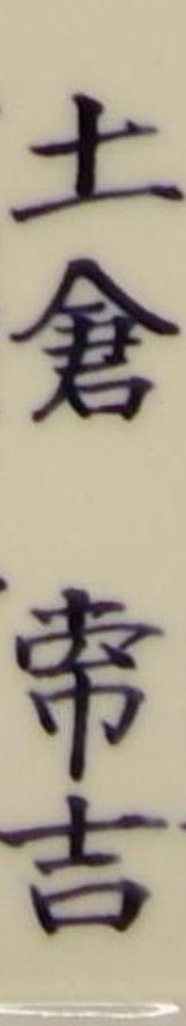土倉常吉
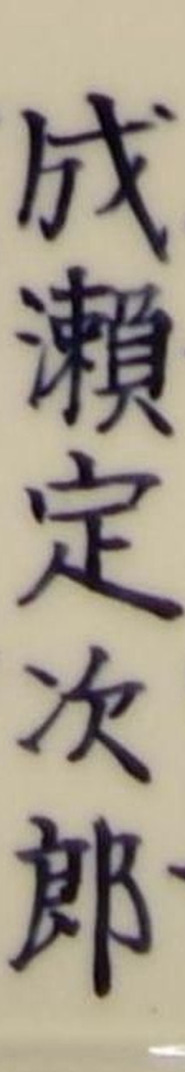成瀬定次郎
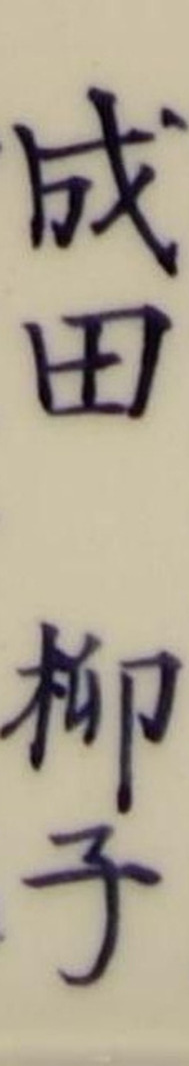成田柳子
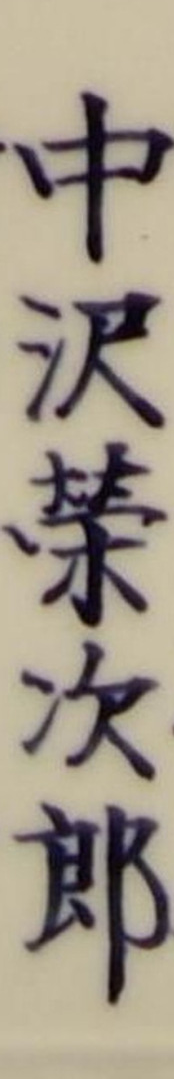中沢榮次郎
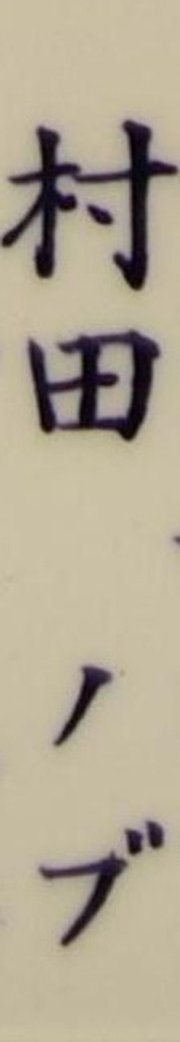村田ノブ
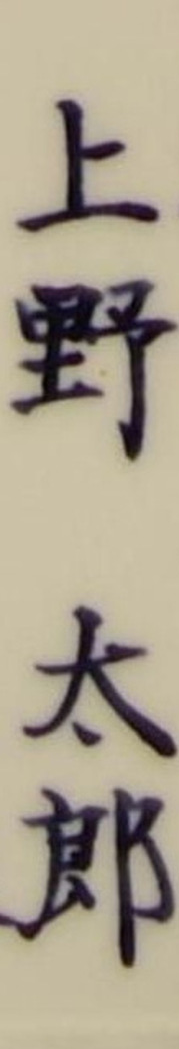上野太郎
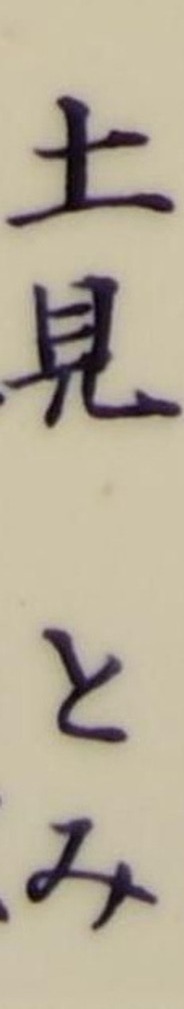土見とみ
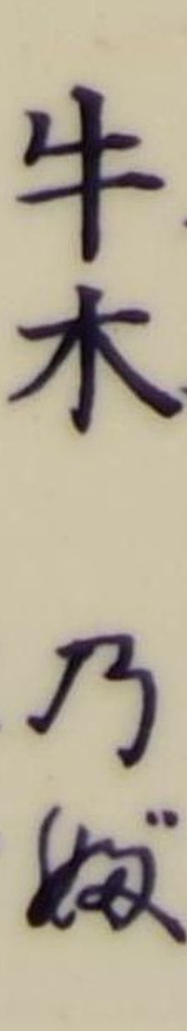牛木のぶ
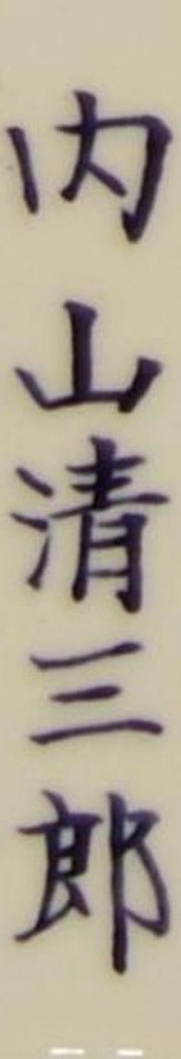内山清三郎
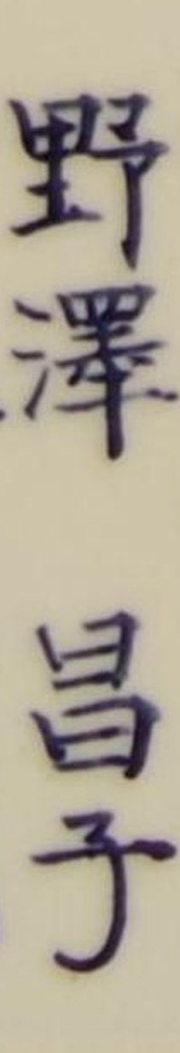野澤昌子
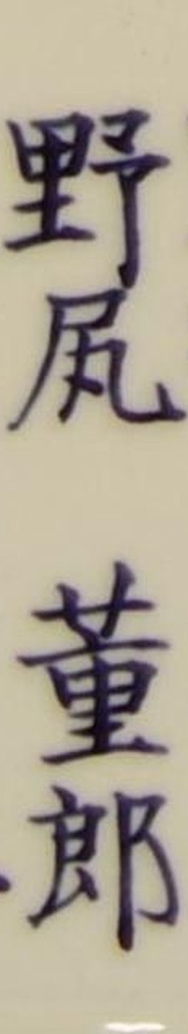野尻董郎
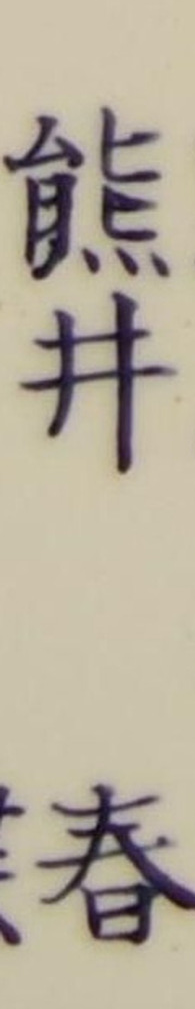熊井春
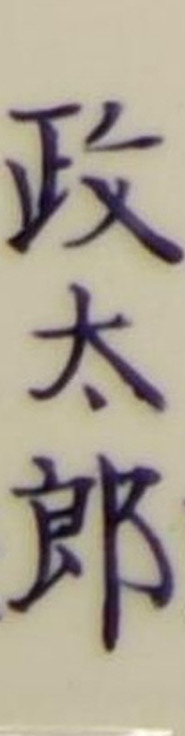政太郎
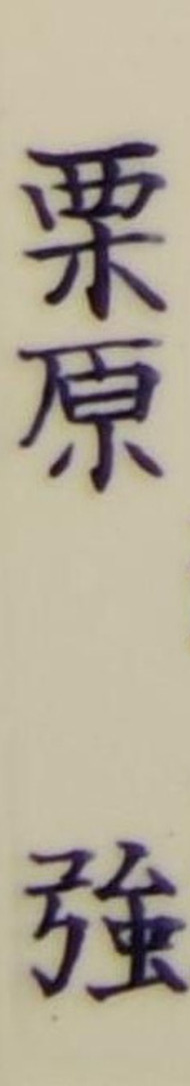栗原強

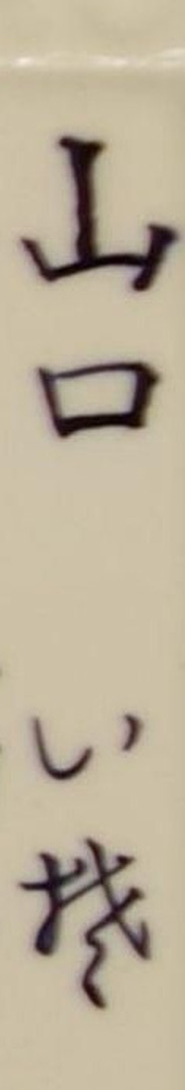山口いそ
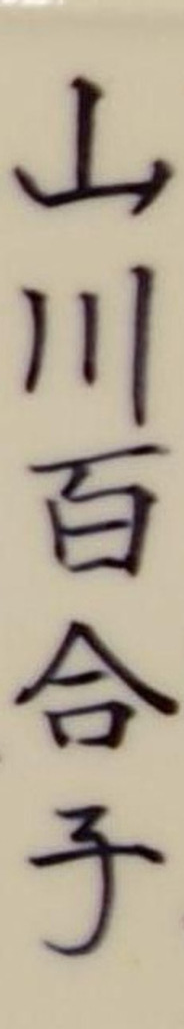山川百合子
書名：A~D
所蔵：koyasan kongobuji
